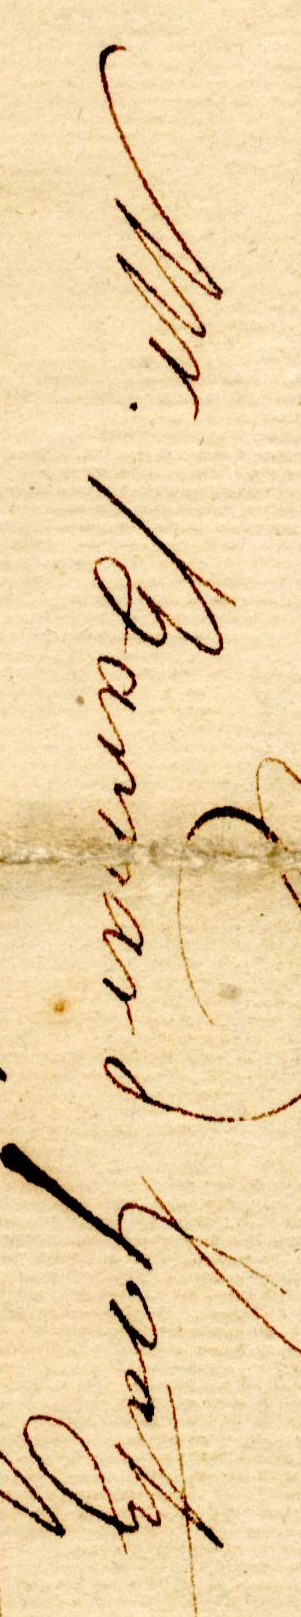M^r Barnard Gratz
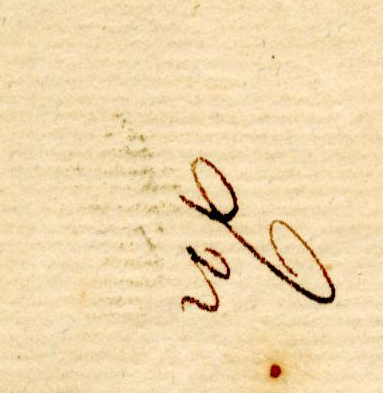In
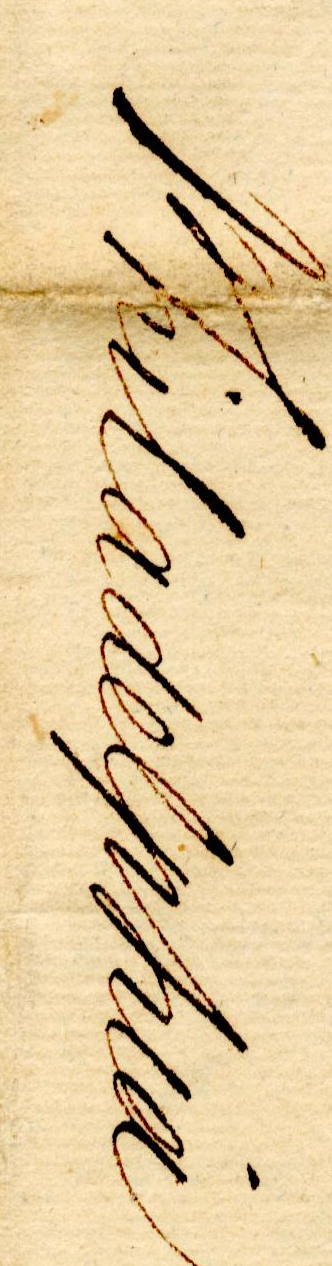Philadelphia
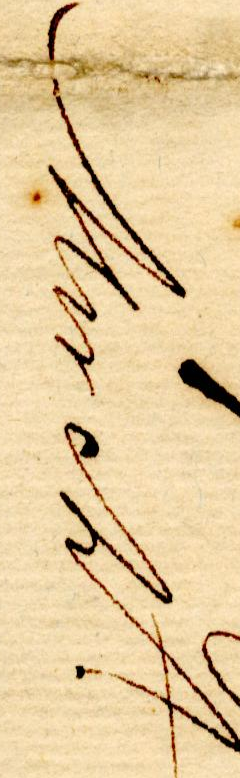Merch^t
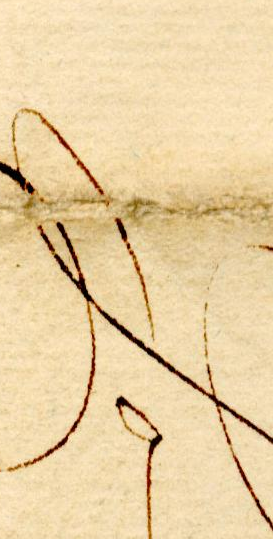To
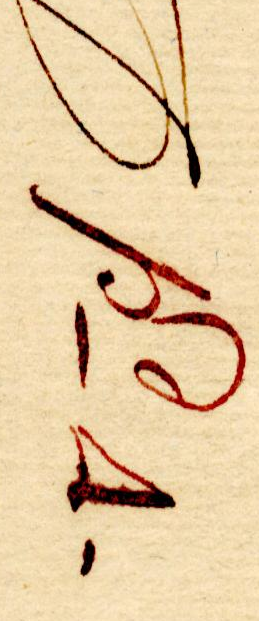P^d 4
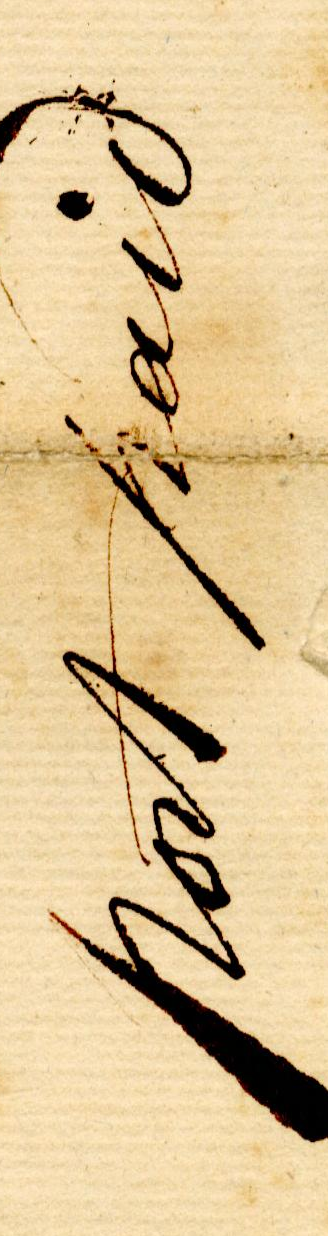Post paid
